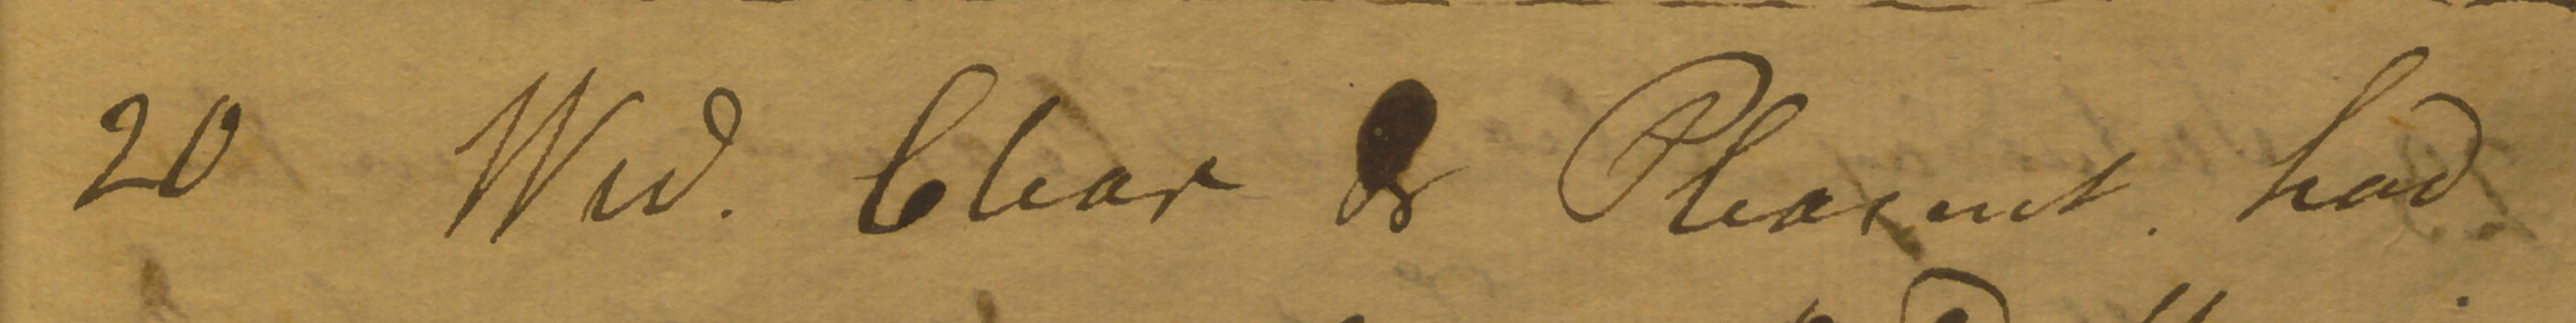20 Wed. Clear & Pleasent had
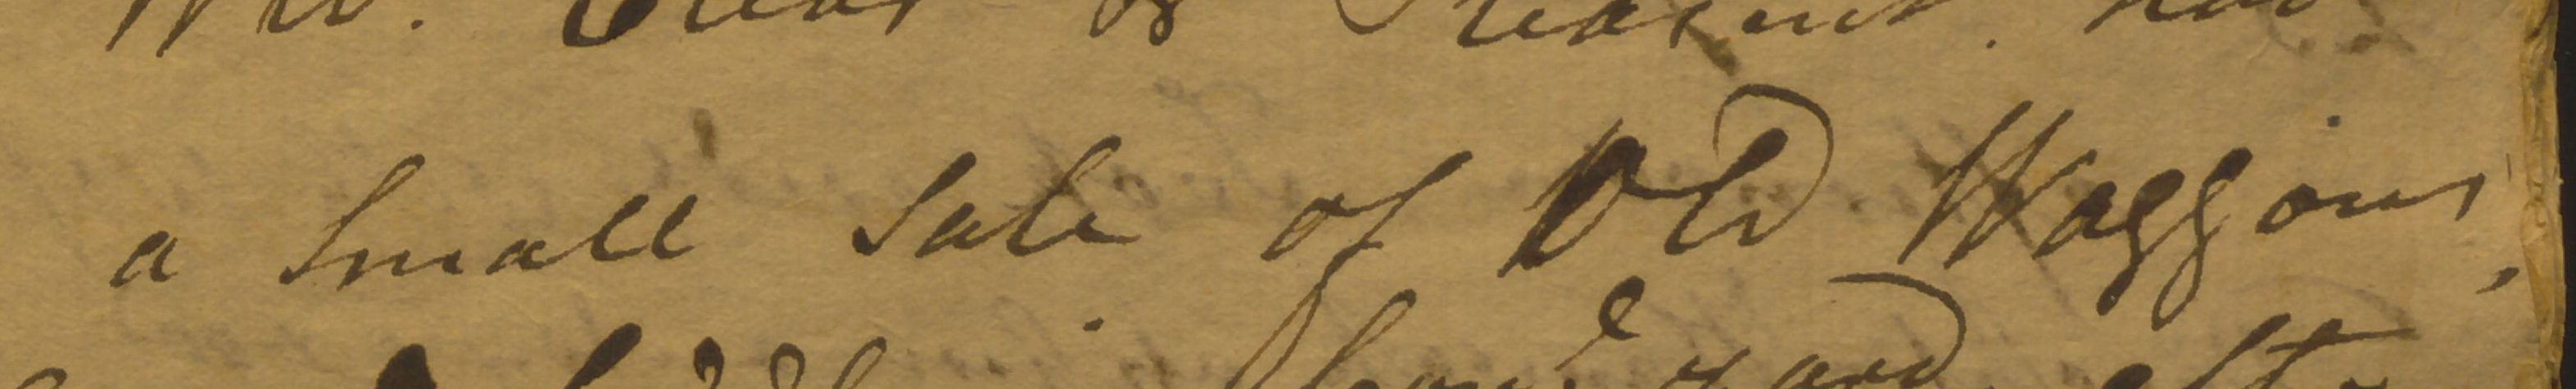a small sale of Old. Waggons
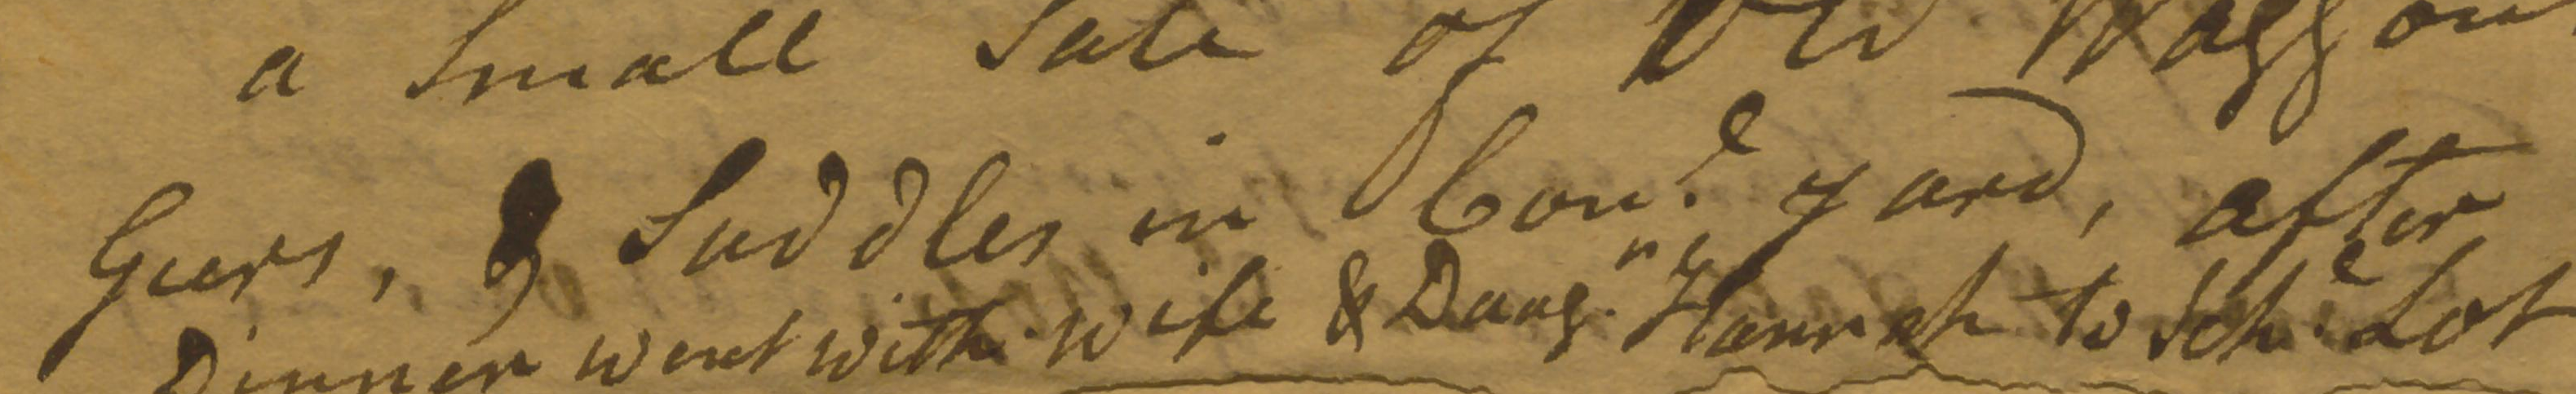Geers. & Saddles in Con^l. yard, after
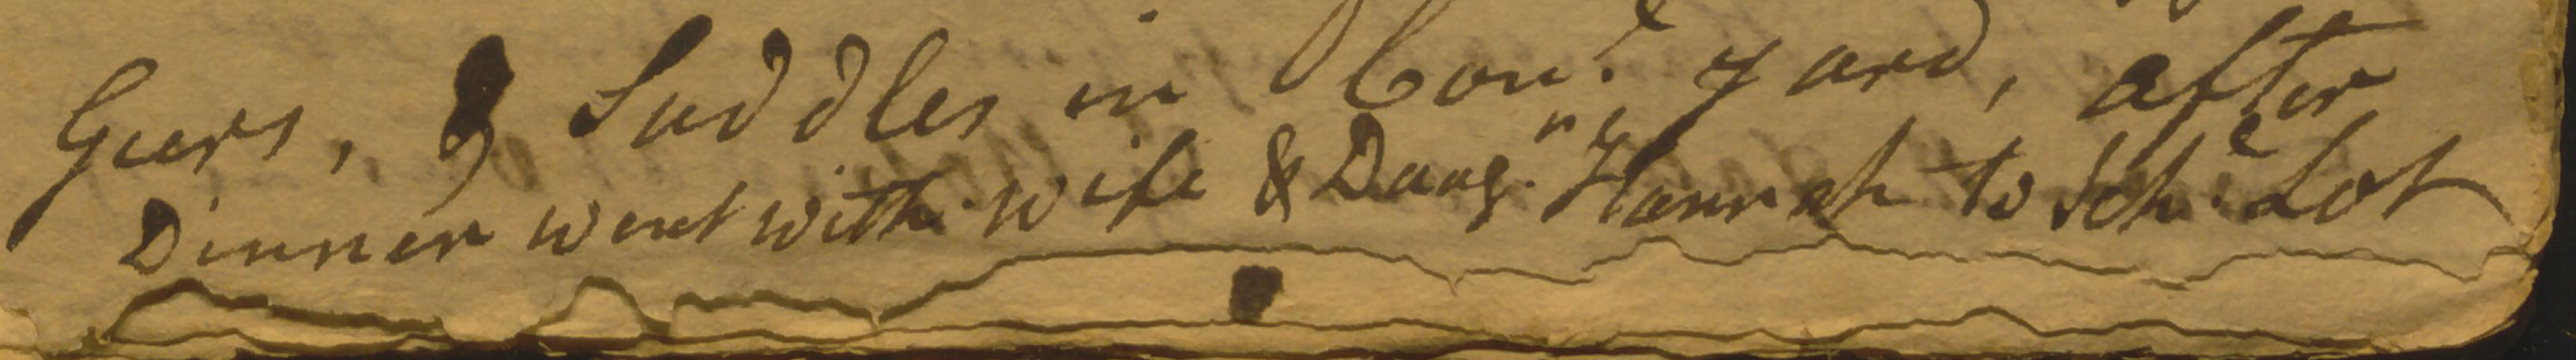Dinner went with wife & Daug^r. Hannah to Sch^l Lot
